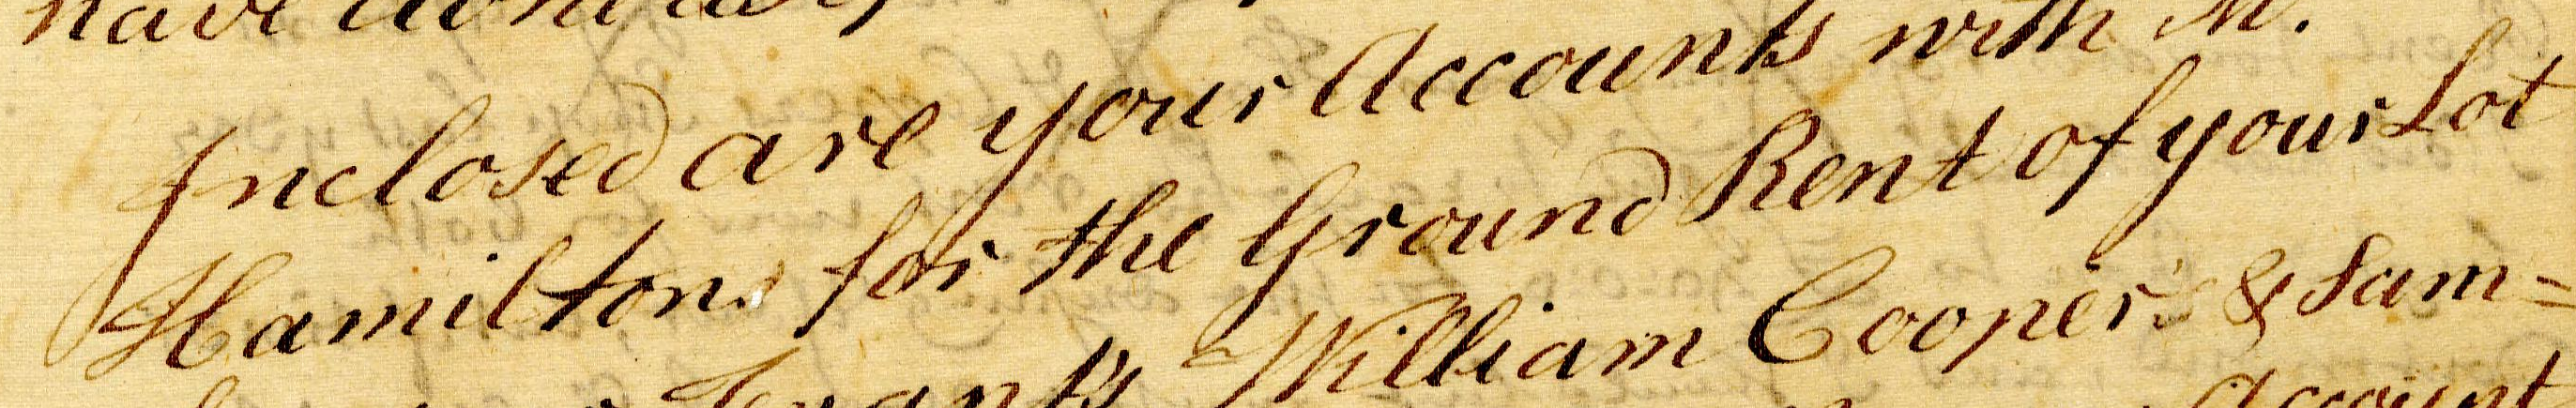Hamilton for the Ground Rent of your Lot
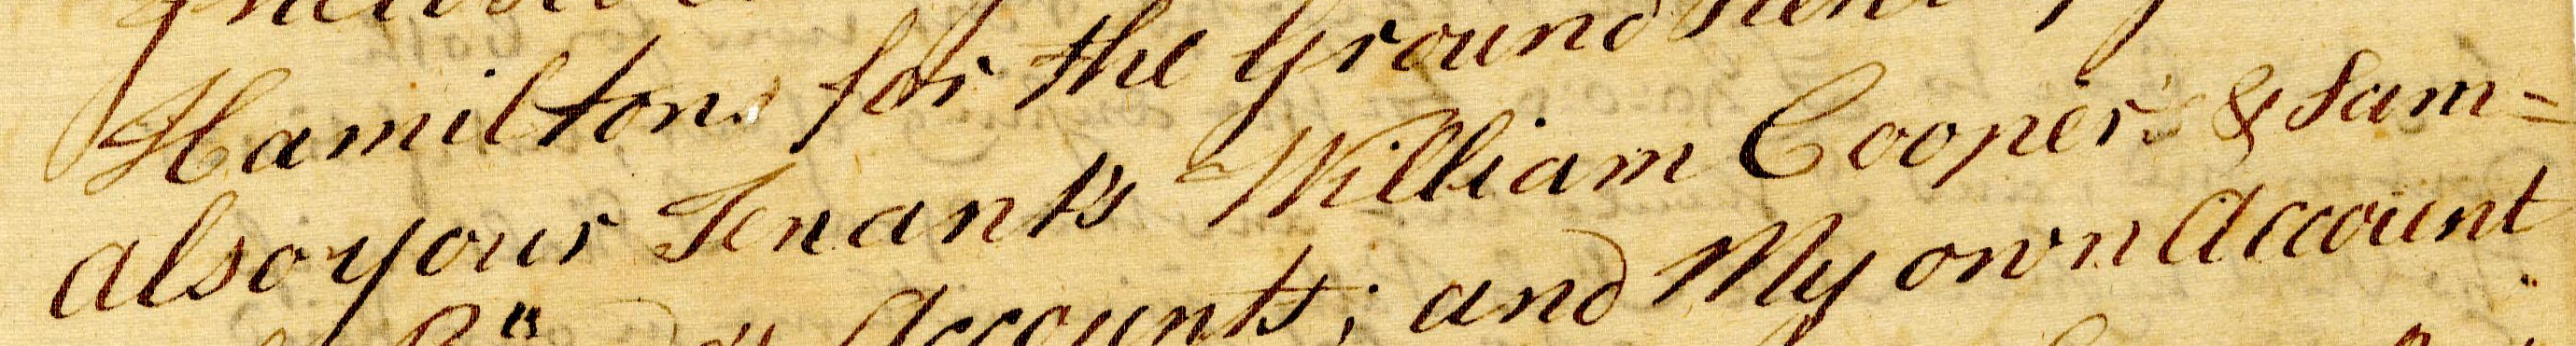Also your Tenants William Cooper & Sam-
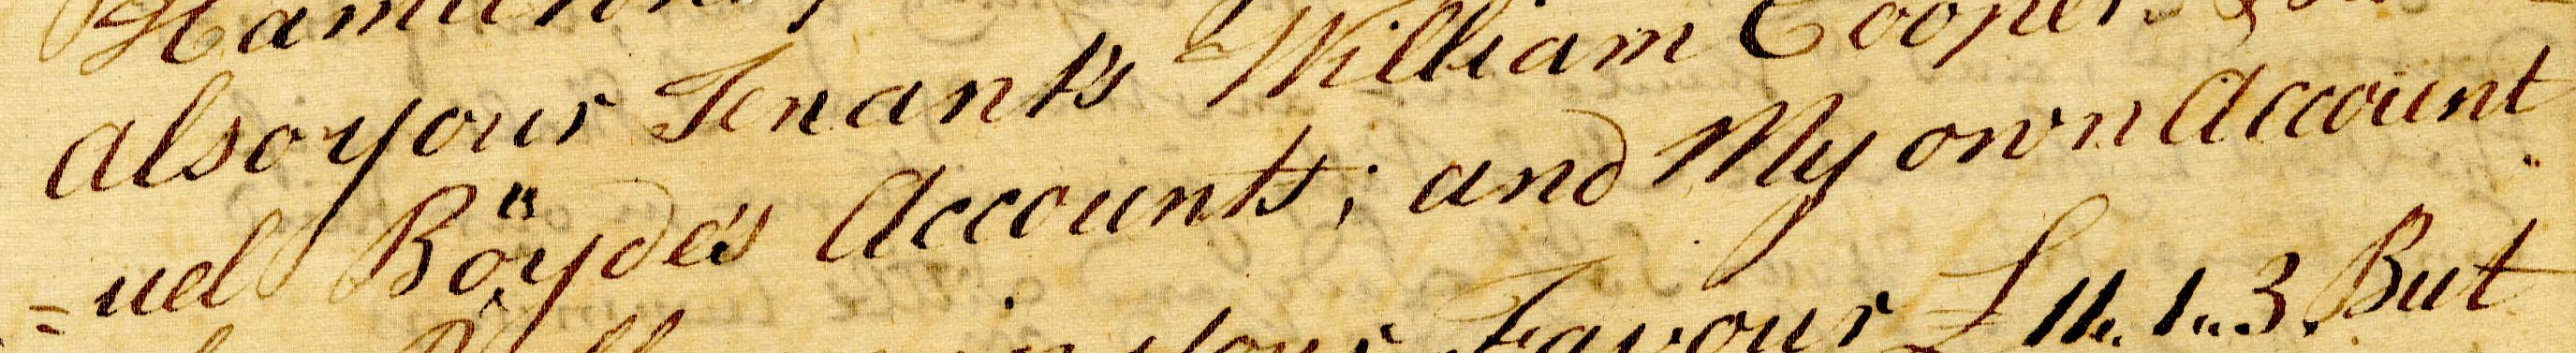-uel Boyde's Accounts; and My own Account
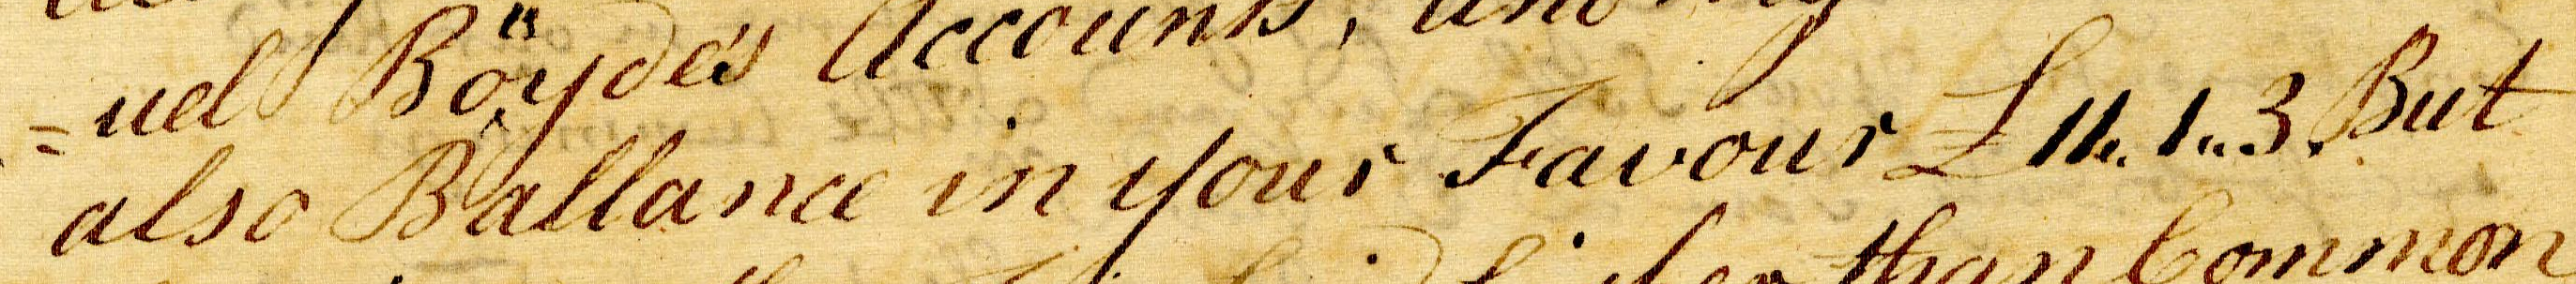also Ballance in your Favour £11.1..3, But
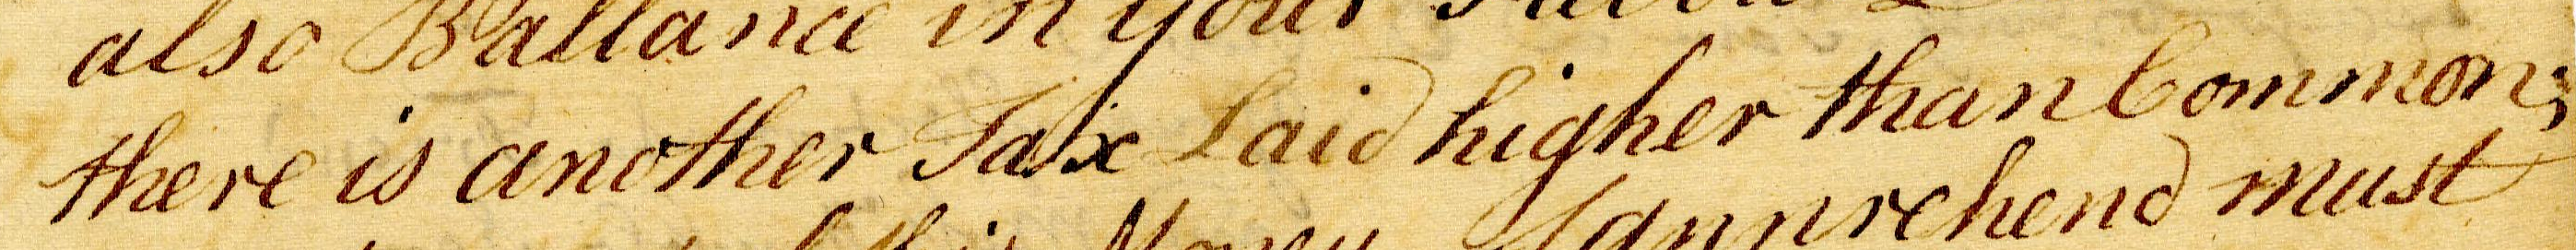there is another Tax laid higher than Common;
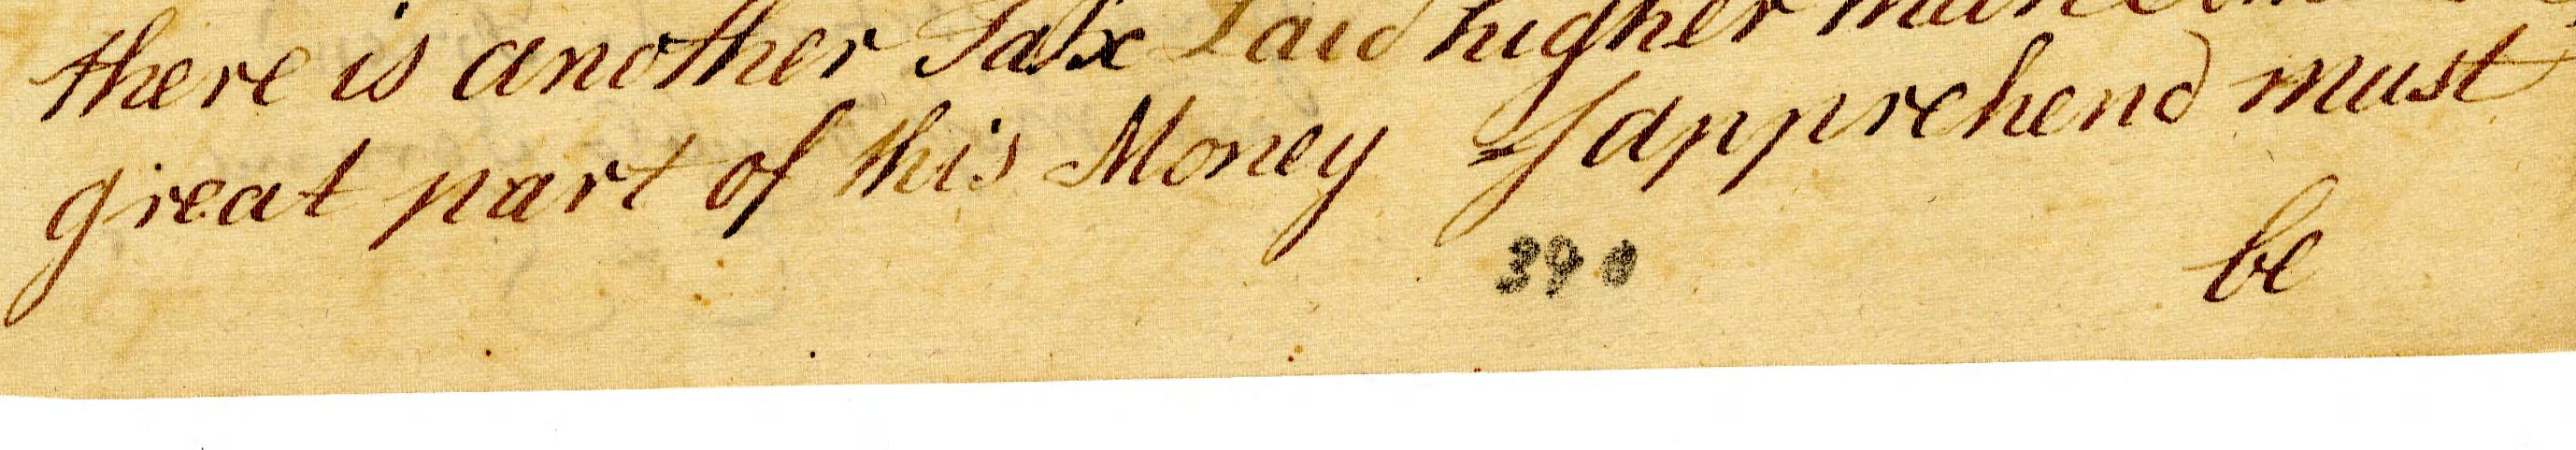great part of this Money I Apprehend must
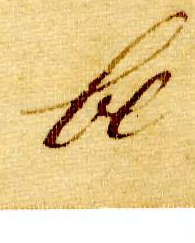be
